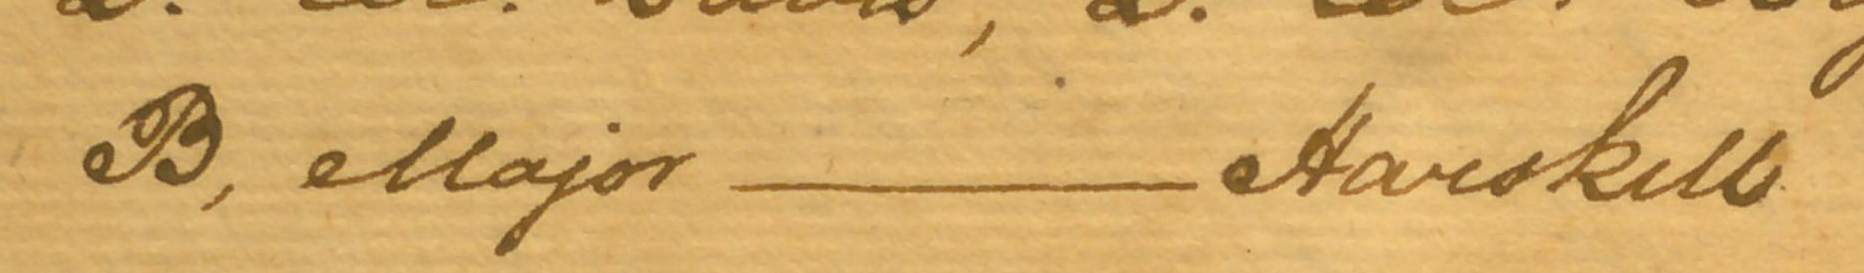B. Major- Harskill
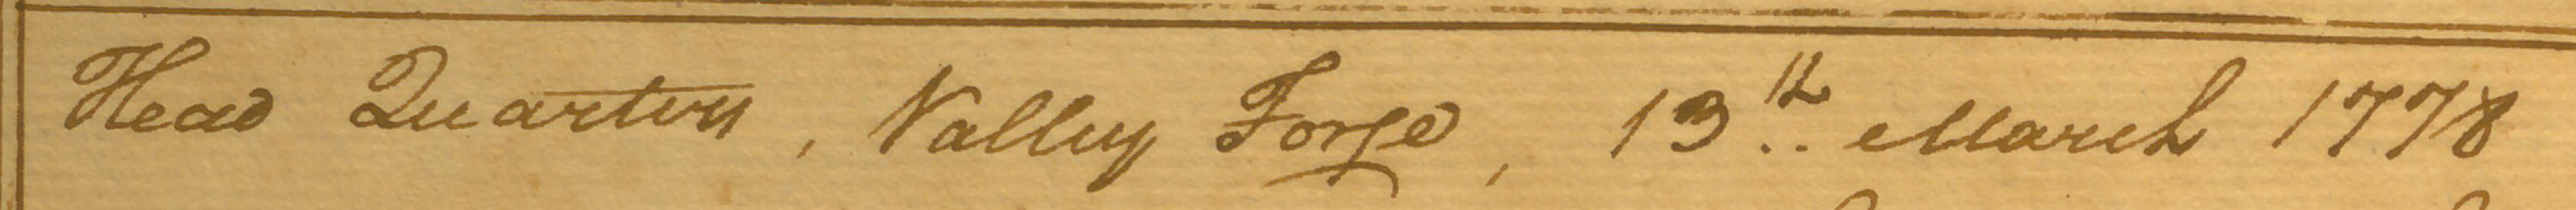Head Quarters, Valley Forge, 13^th. March 1778
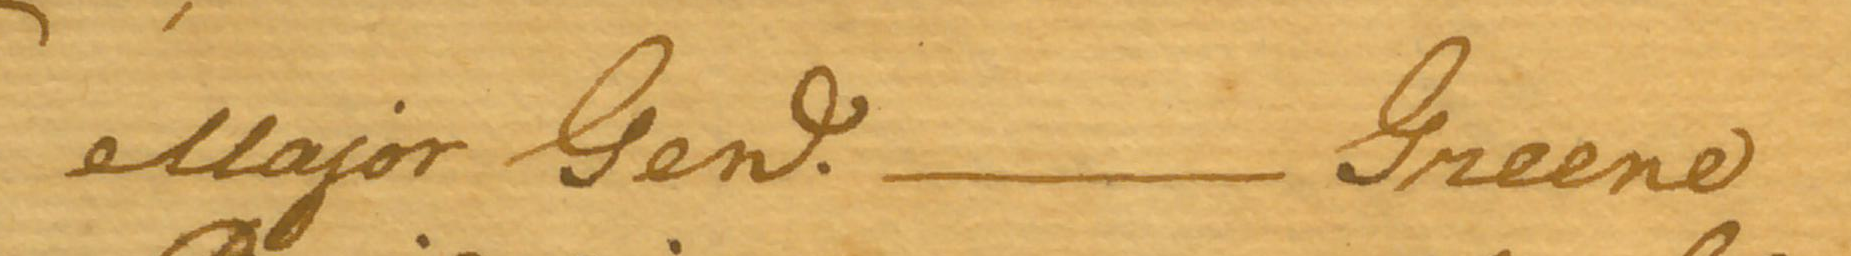Major Gen^l.- Greene
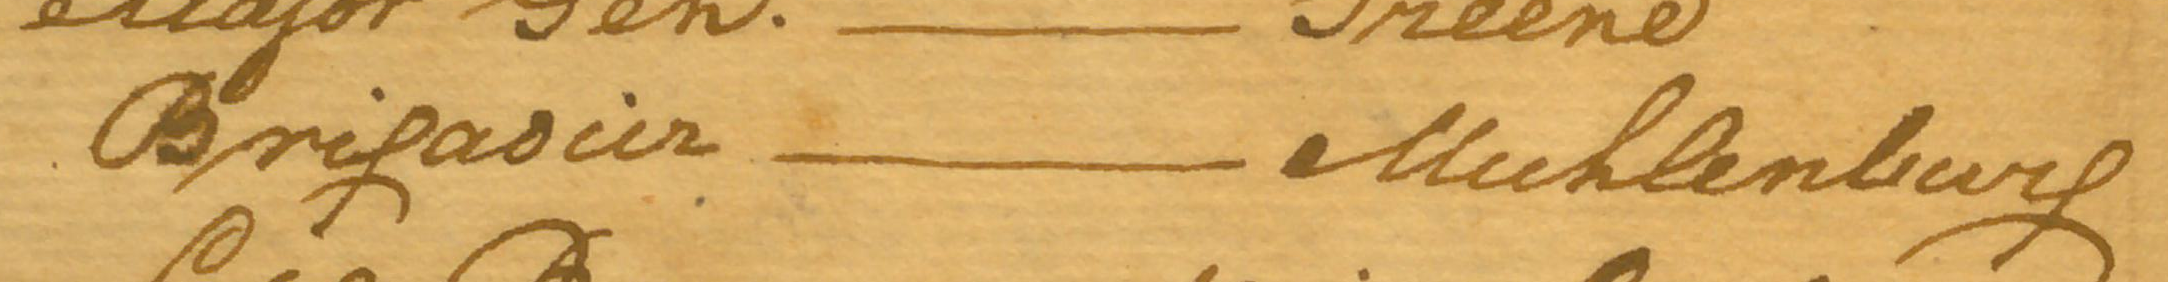Brigadier- Muhlenburg
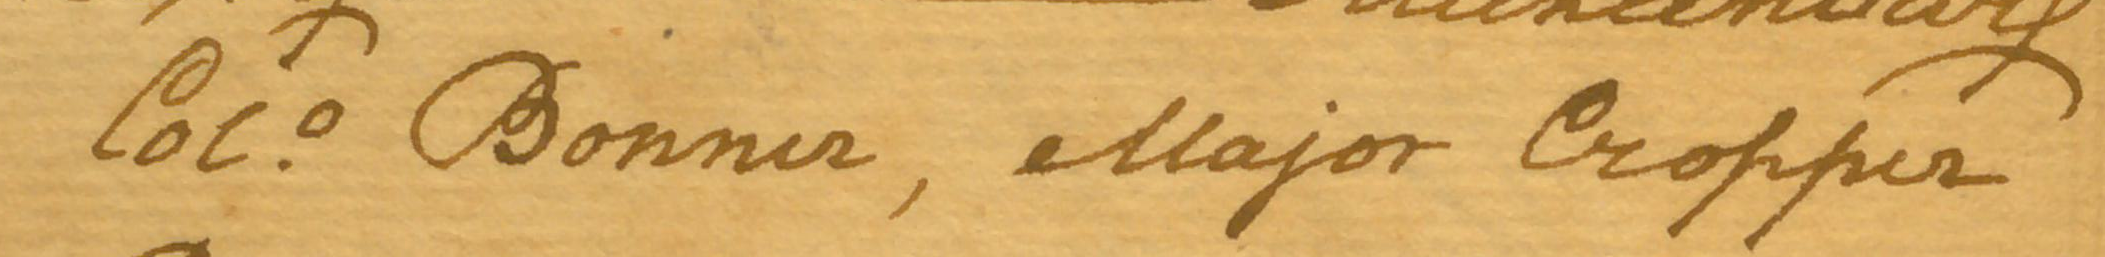Col^o. Bonner, Major Cropper
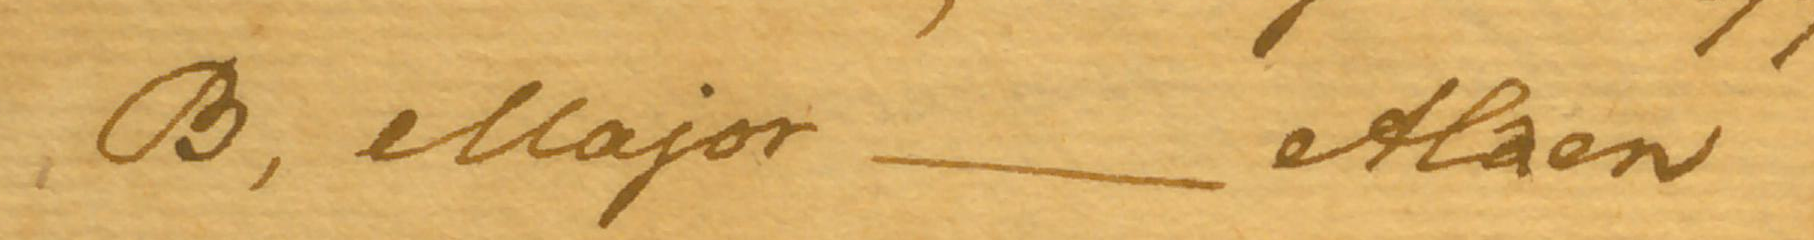B. Major- Alden
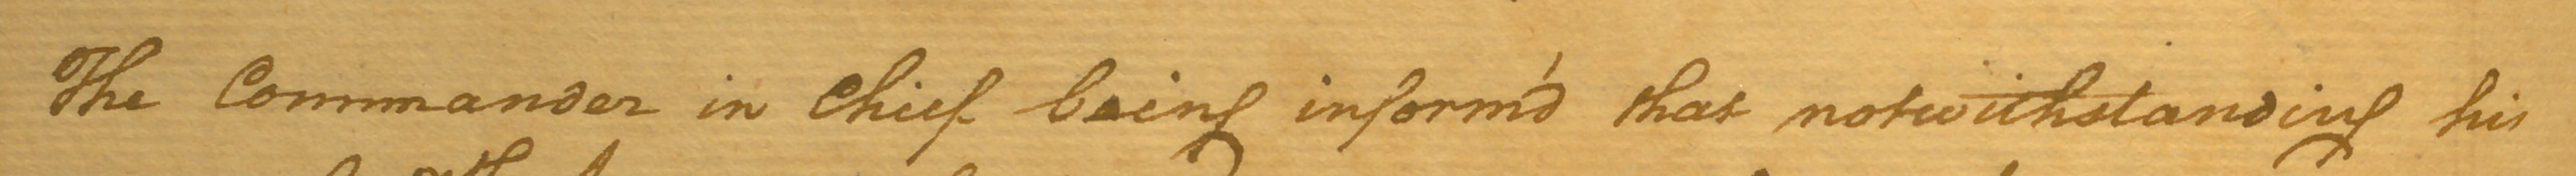The Commander in Chief being inform'd that notwithstanding his
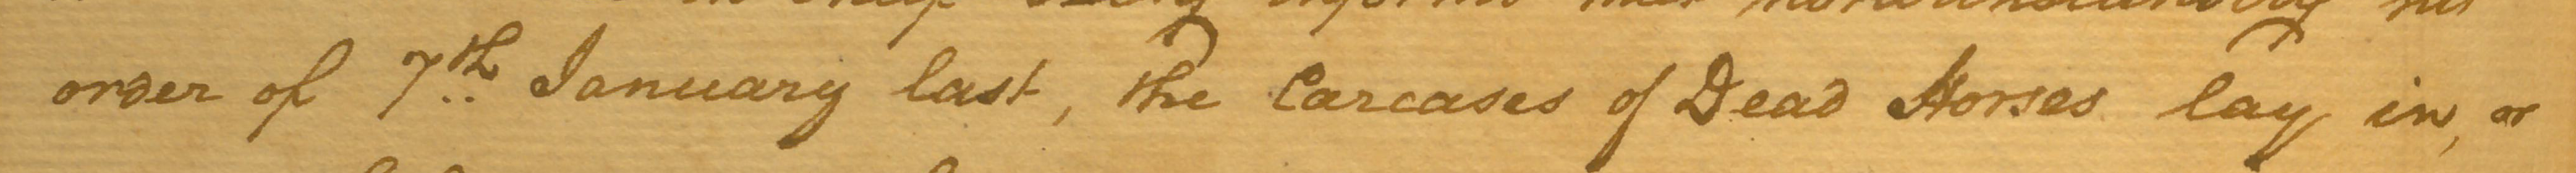order of 7^th. January last, the Carcases of Dead Horses lay in, or
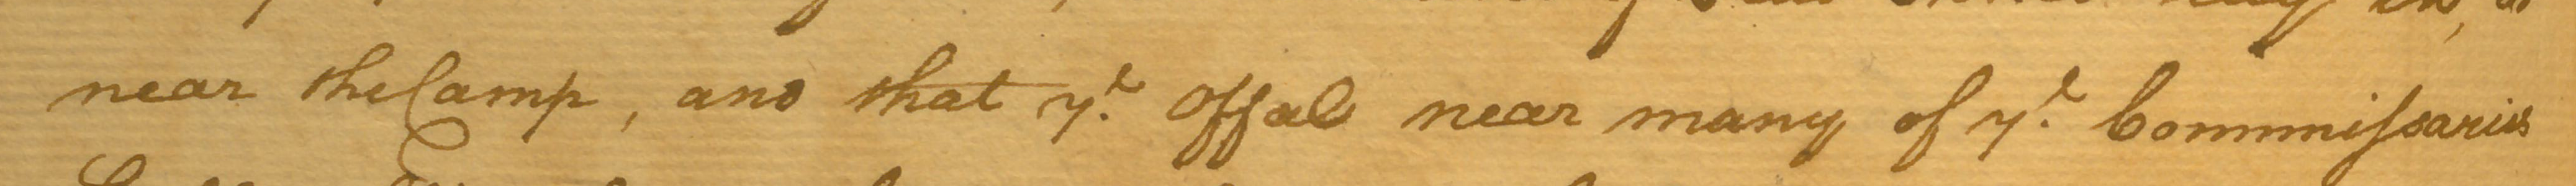near the Camp, and that y^e. Offal near many of y^e. Commissaries
